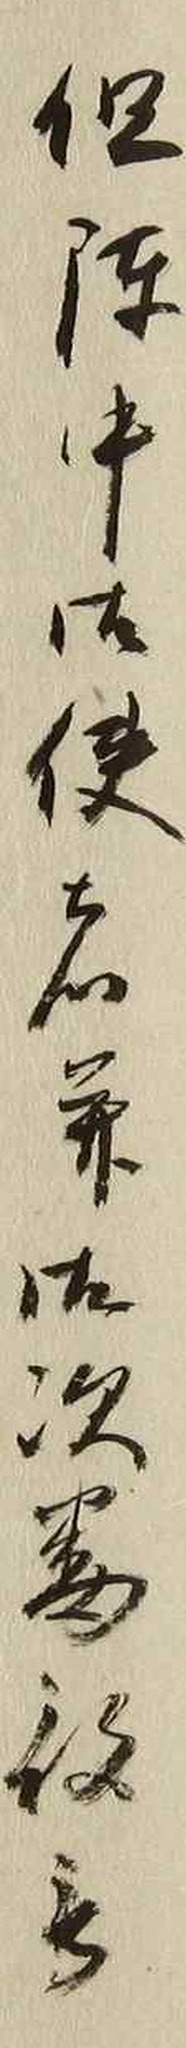但陣中御使者并御次番役被
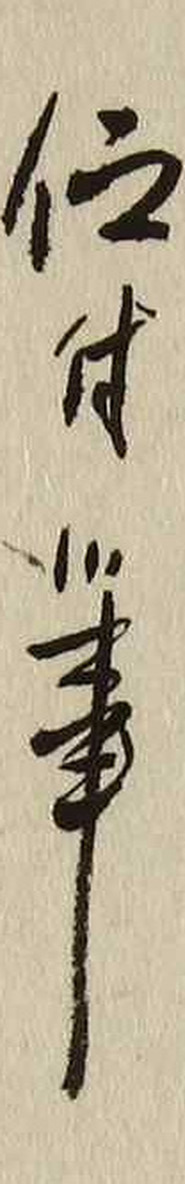仰付候事
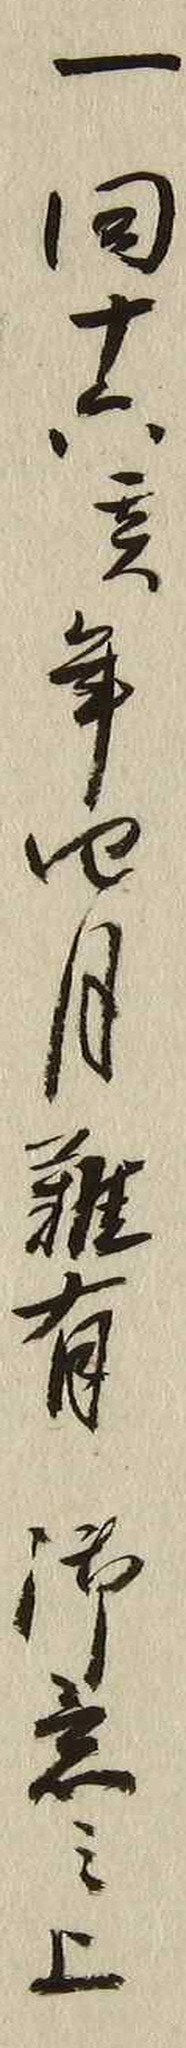一同十六亥年四月難有御意之上
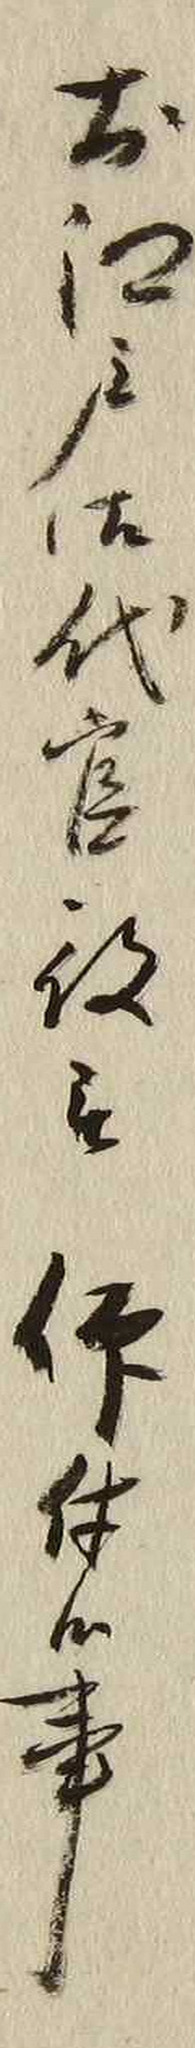於江戸御代官役被仰付候事
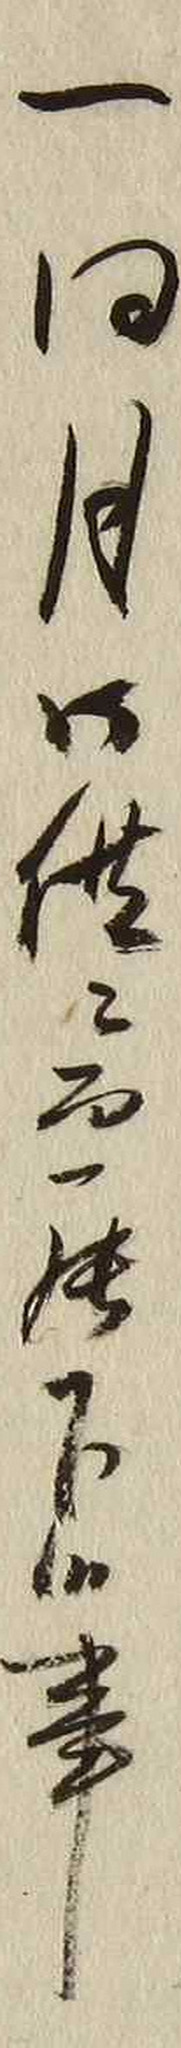一同月御供ニ而罷下候事
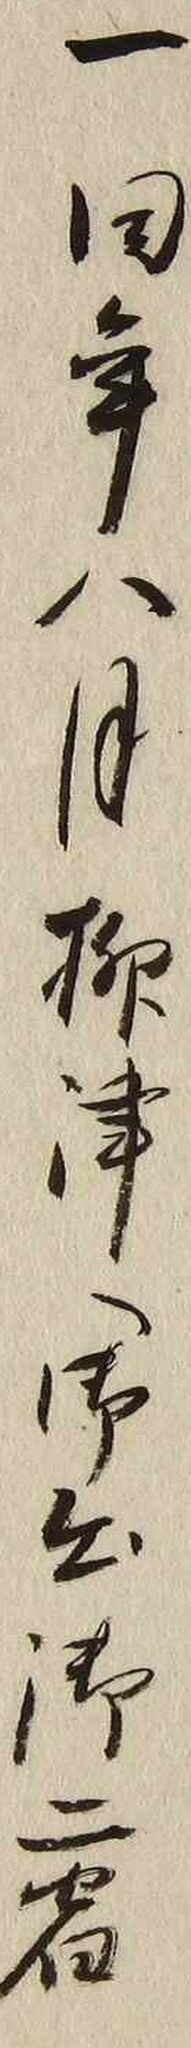一同年八月柳津へ御出御二宿
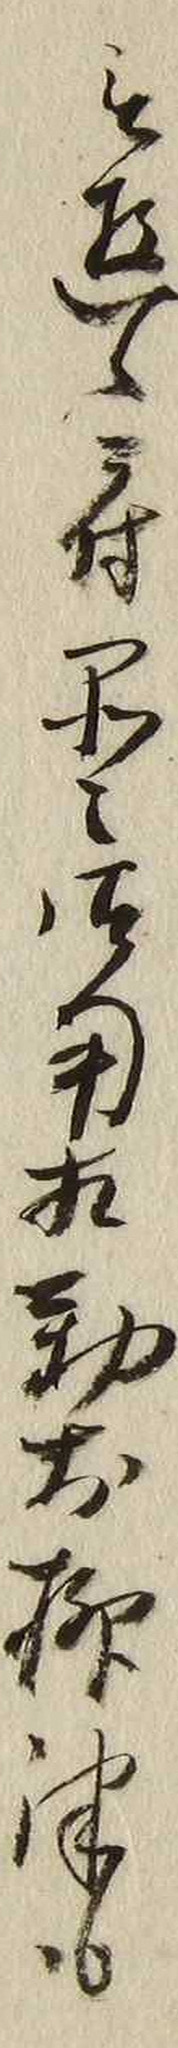被遊候ニ付品々御用相勤於柳津も
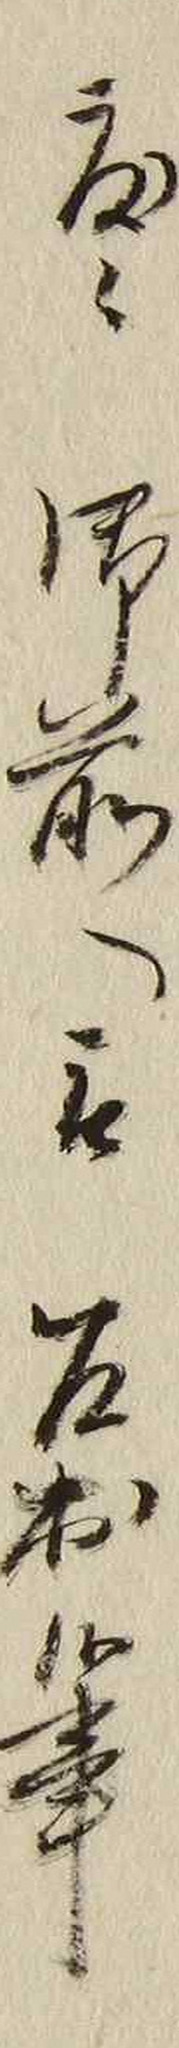度々御前へ被召出候事
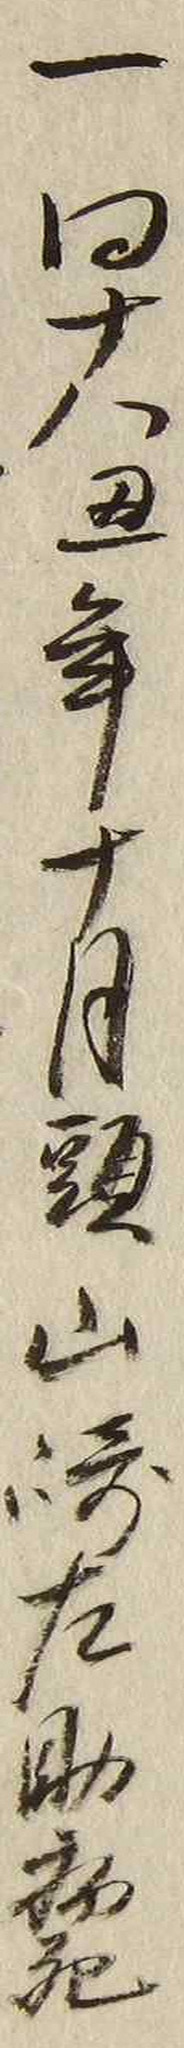一同十八丑年十月頭山崎左助病死
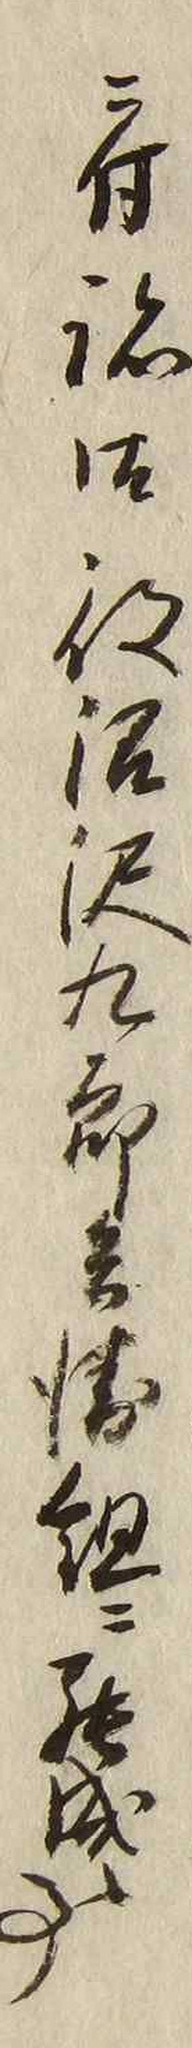ニ付跡御役沼沢九郎兵衛組ニ罷成候事

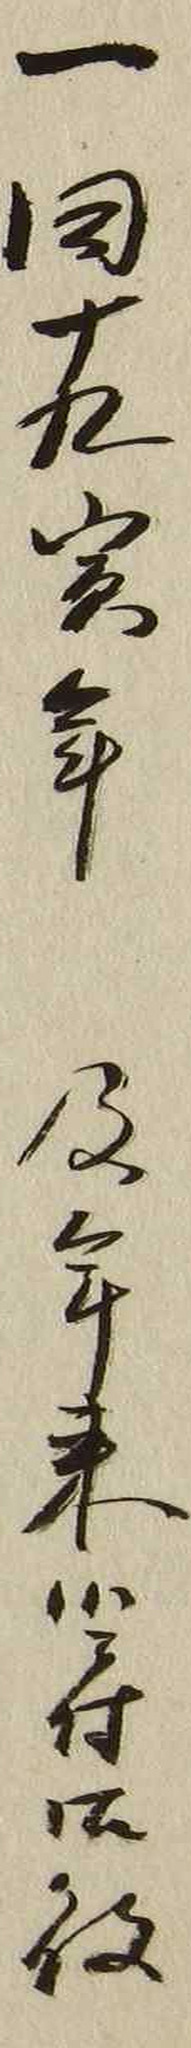一同十九寅年及年来候ニ付御役
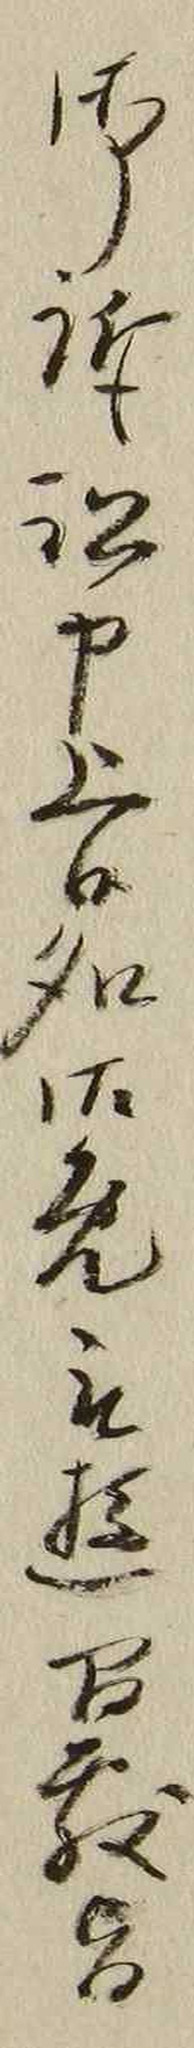御訴訟申上候処御免被遊間敷旨
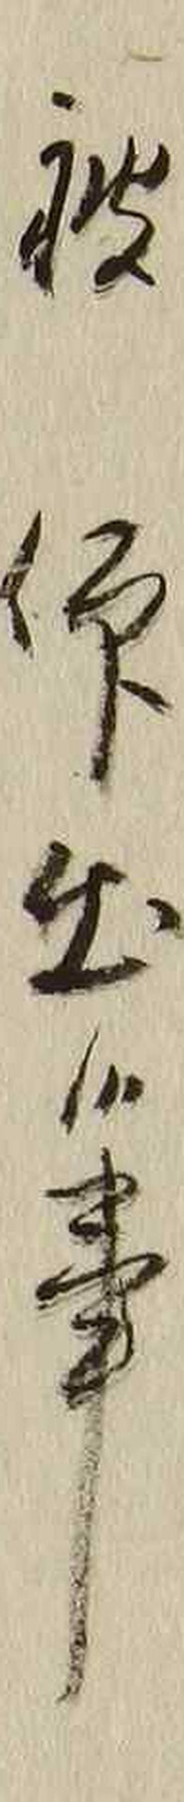被仰出候事
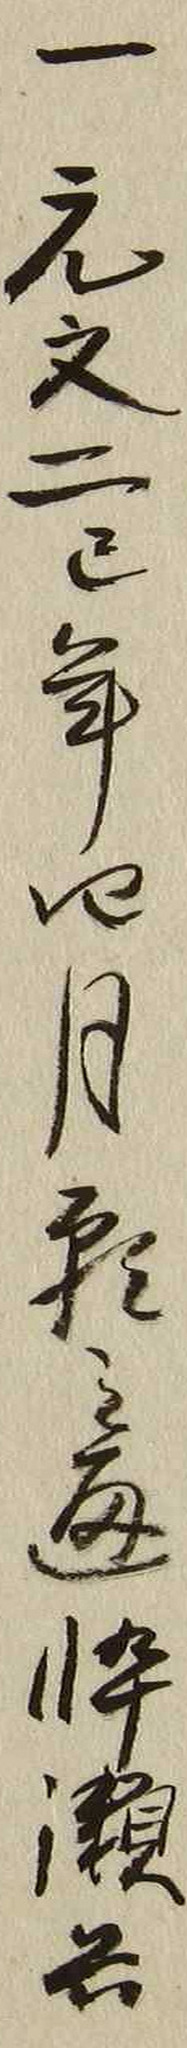一元又二巳年四月願之通忰瀬兵
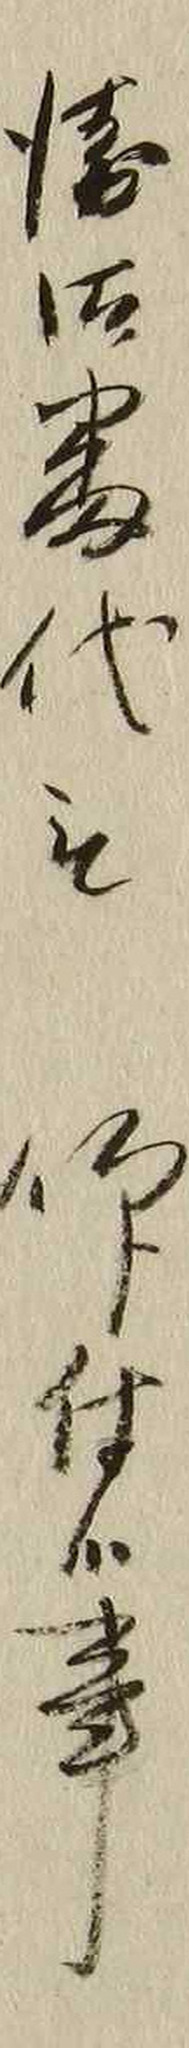衛御番代被仰付候事
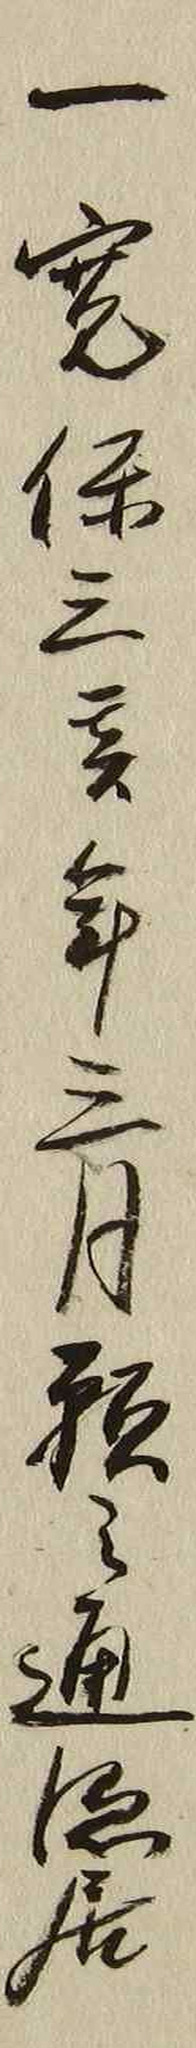一寛保三亥年三月願之通隠居
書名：諸士系譜　巻之346　も之部2
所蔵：会津若松市立会津図書館
